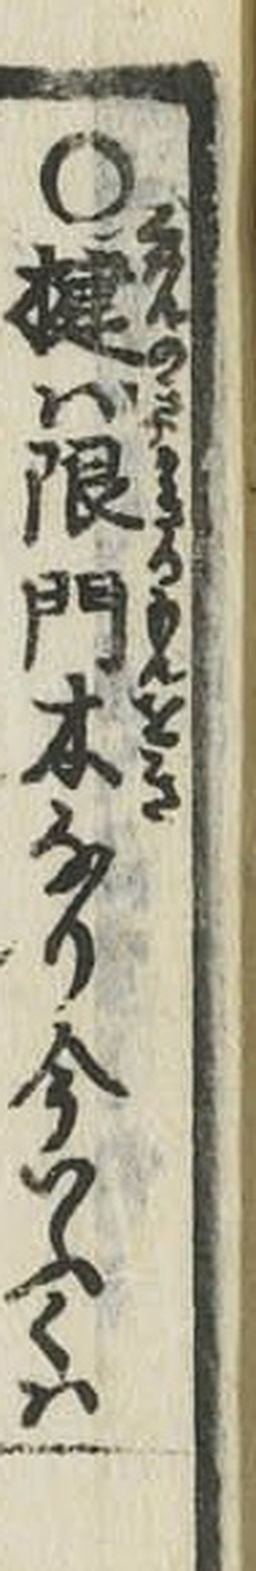○揵は限門木なり今いふくは
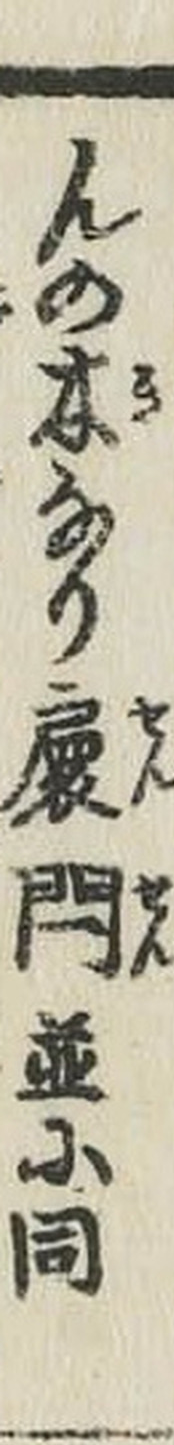んの木なり𢩠閂並に同
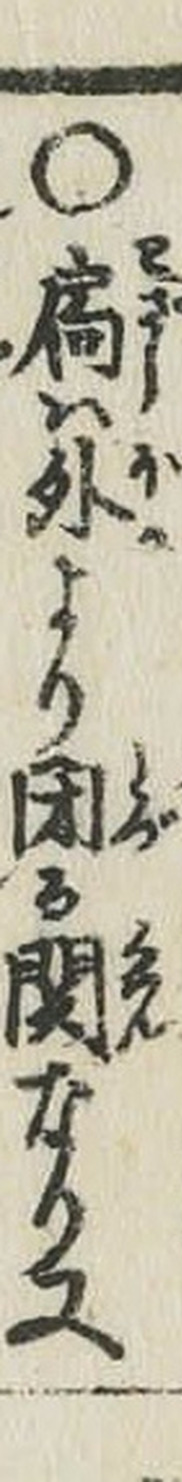○扄は外より閉る関なり又
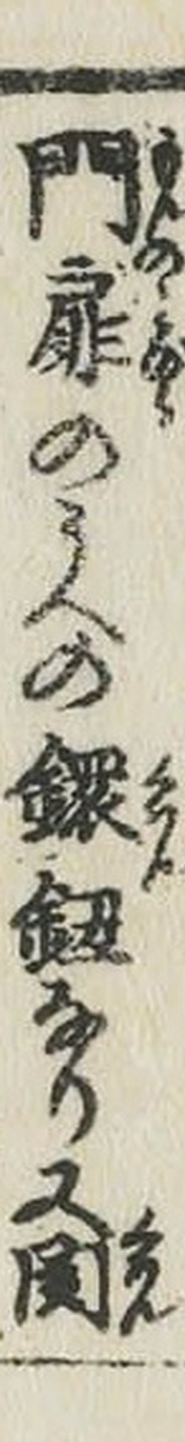門扉のうへの鐶鈕なり又関
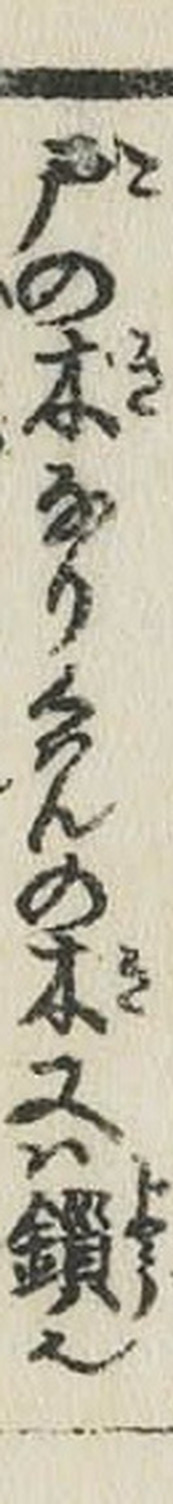戸の木なりくはんの木又は鎖也
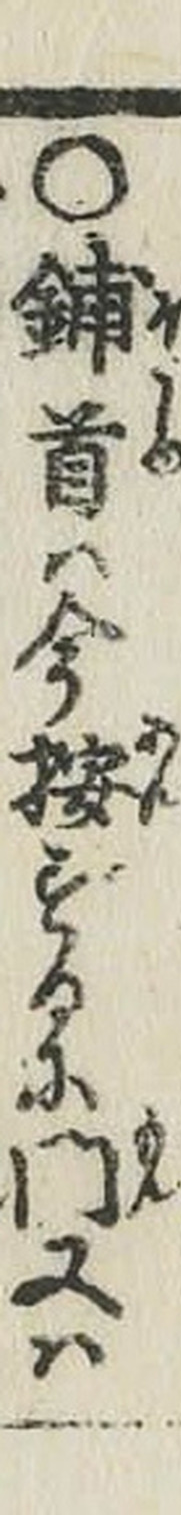○鋪首は今按ずるに門又は
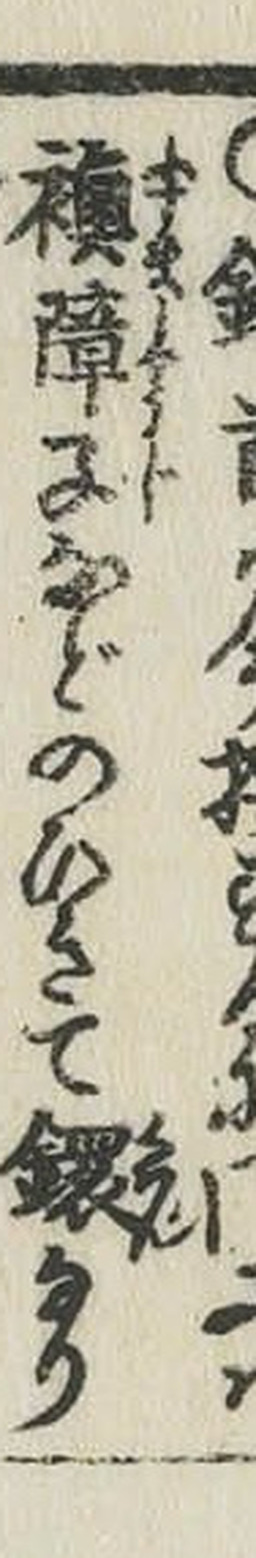襖障子などのひきて鐶なり
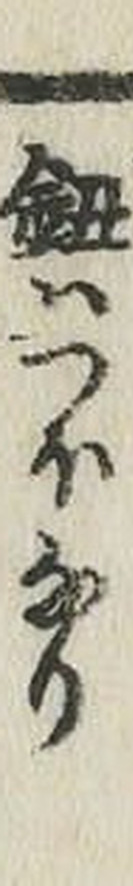鈕はつほなり
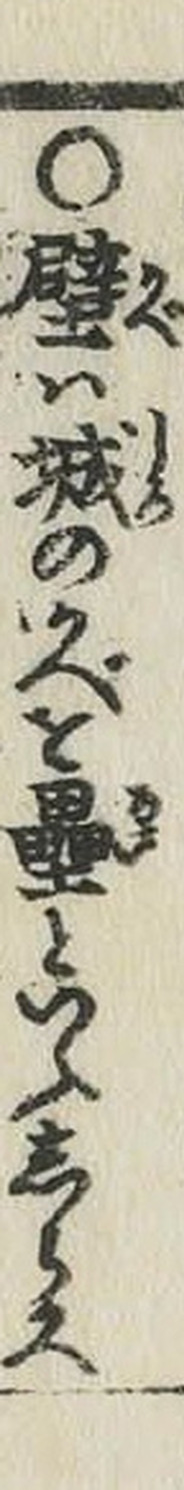○壁は城のかべを壘といふしらかへ
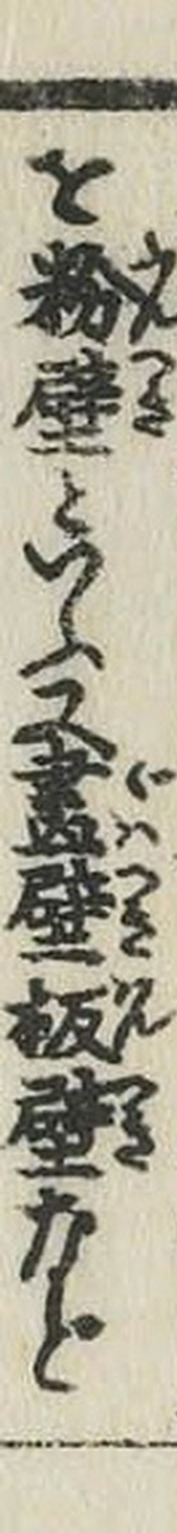を粉壁といふ又画壁板壁など
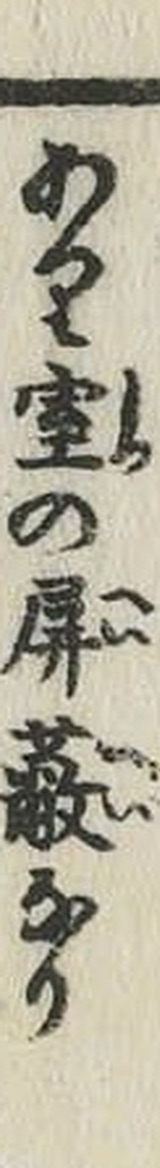あり室の屏蔽なり
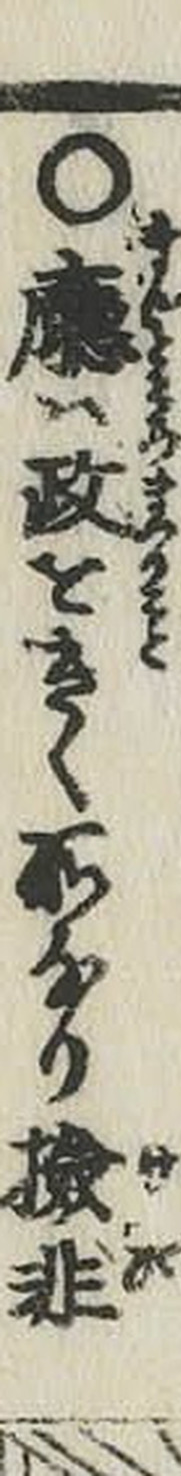○廰は政をきく所なり撿非
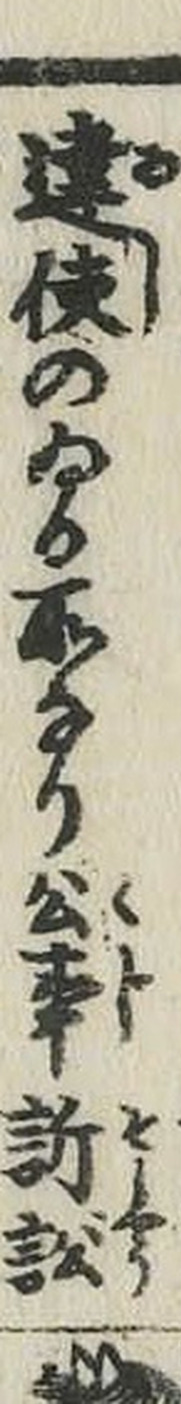違使のゐる所なり公事訴訟
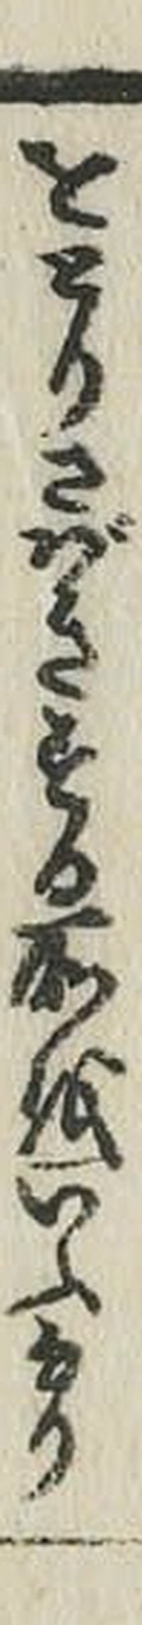をとりさばきする所をいふなり
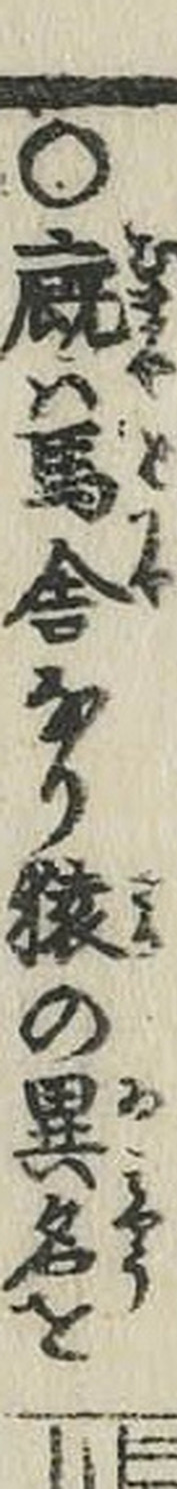○厩は馬舎なり猿の異名を
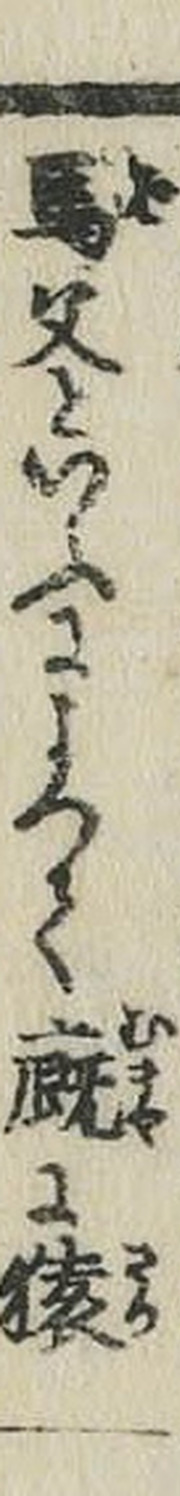馬父といふによつて厩に猿
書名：増補頭書訓蒙図彙大成 10巻 2:巻之1-3
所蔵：東京学芸大学教育コンテンツアーカイブ
